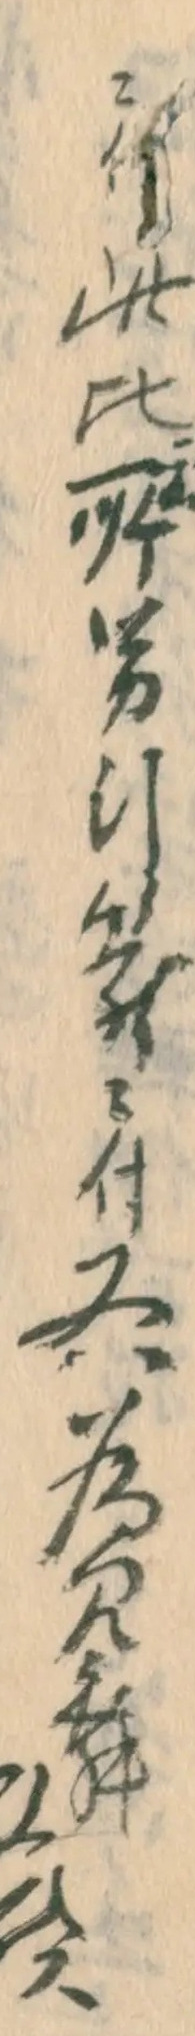ニ付此頃称所労引籠ニ付右為見舞罷越ス
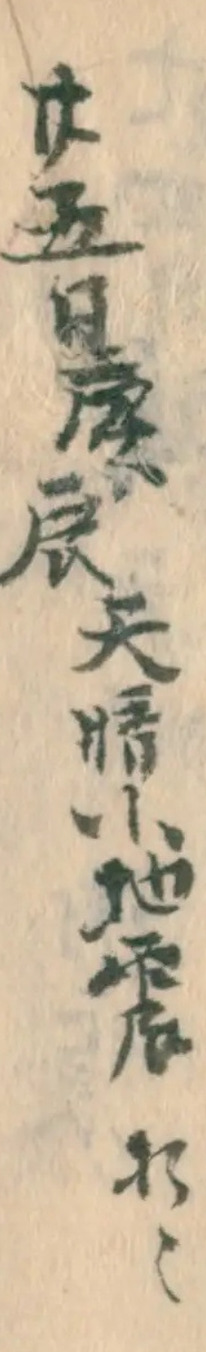廿五日庚辰天晴小地震折々
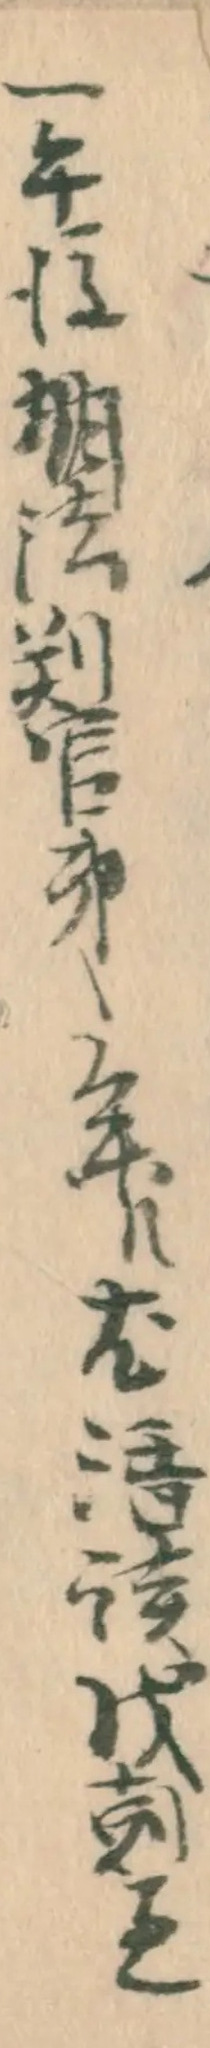一午後明法判官第へ参ル尤清談戌刻過
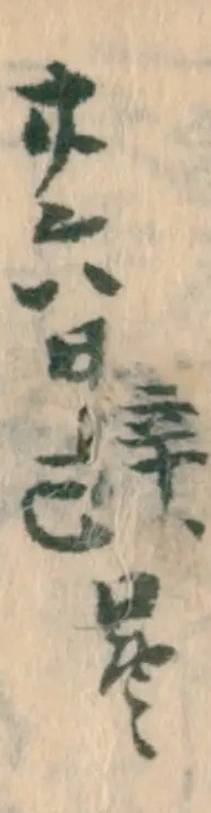廿六日辛巳曇
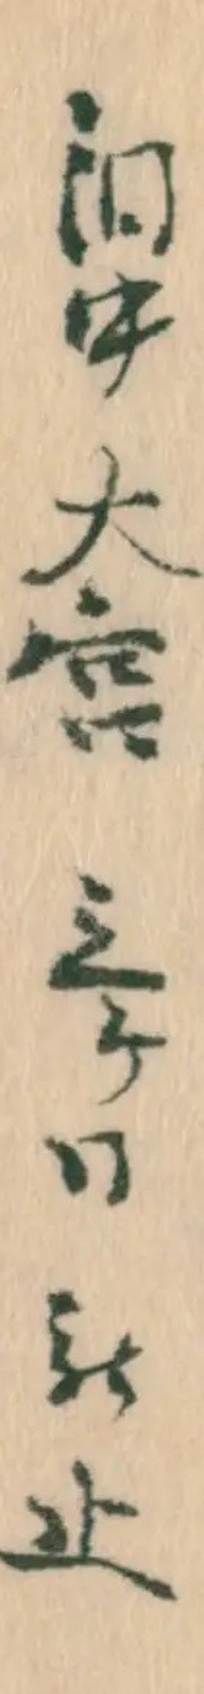洞中大宮三ケ日被止
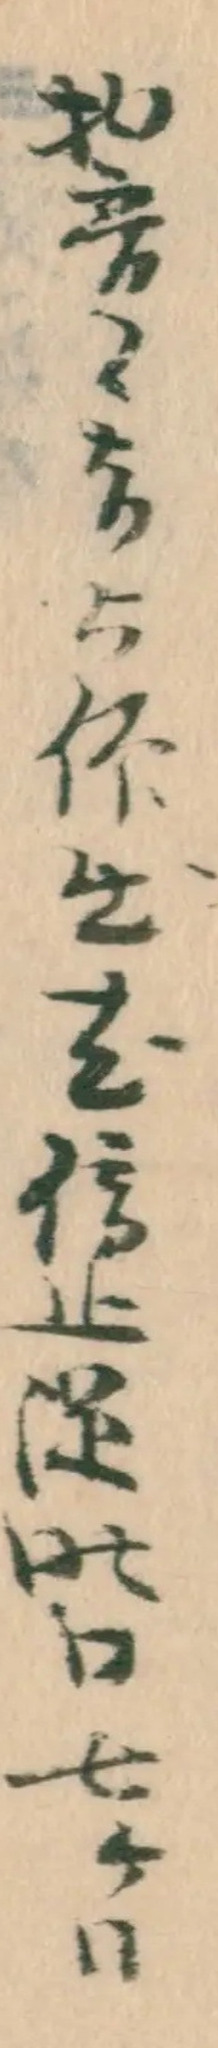物音候旨被仰出尤停止従昨日七ケ日
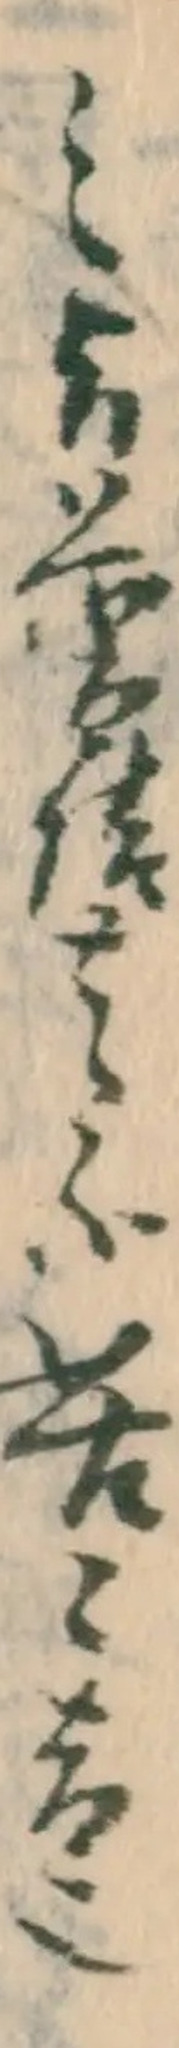之旨普請は不苦候旨也
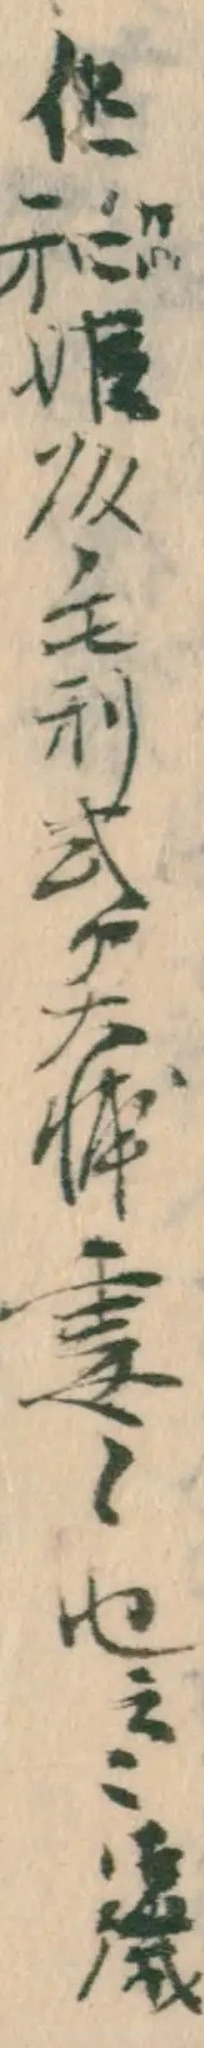但和姫殿毛利式部大輔妻之由云々御歳
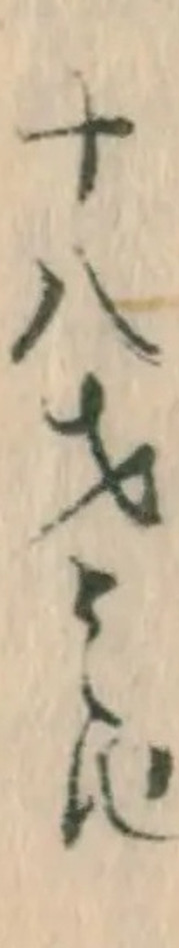十八才之由
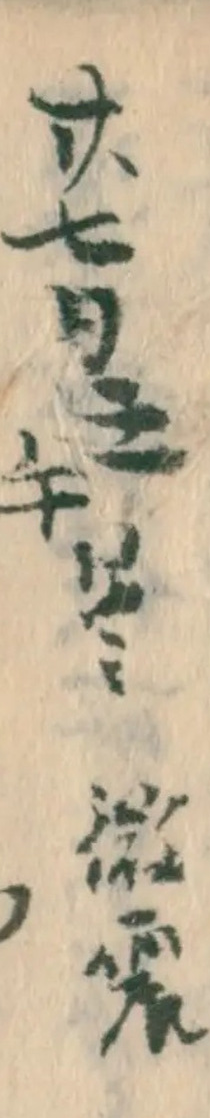廿七日壬午曇微震
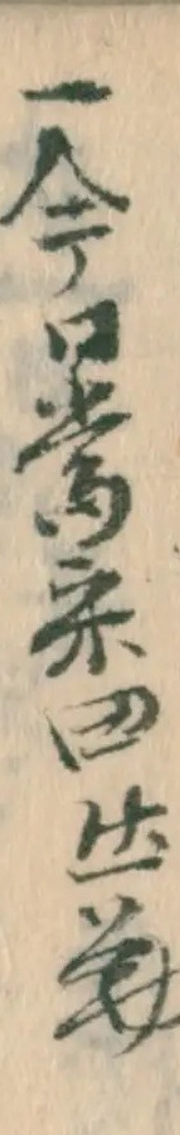一今日当番出勤

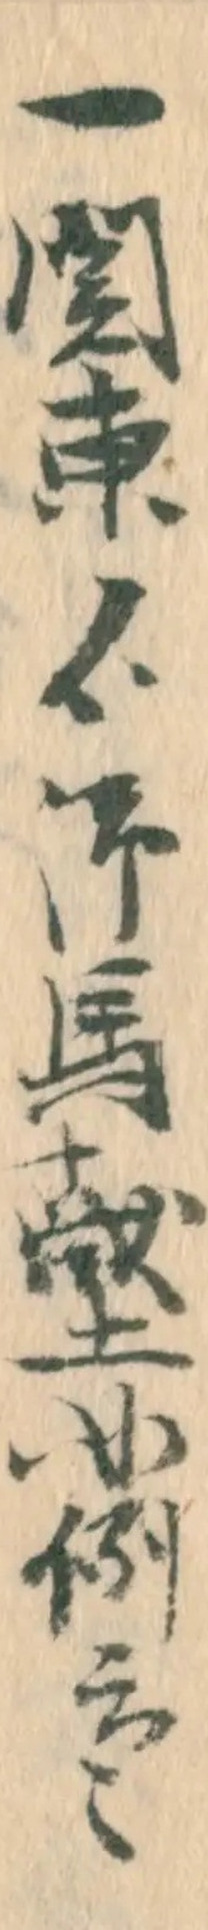一関東ゟ御馬献上如例云々
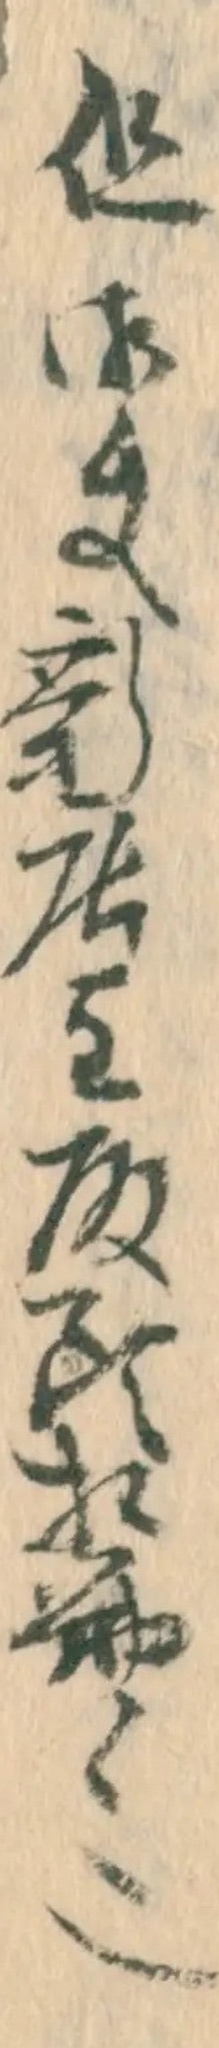但御使新庄主殿頭相勤候也
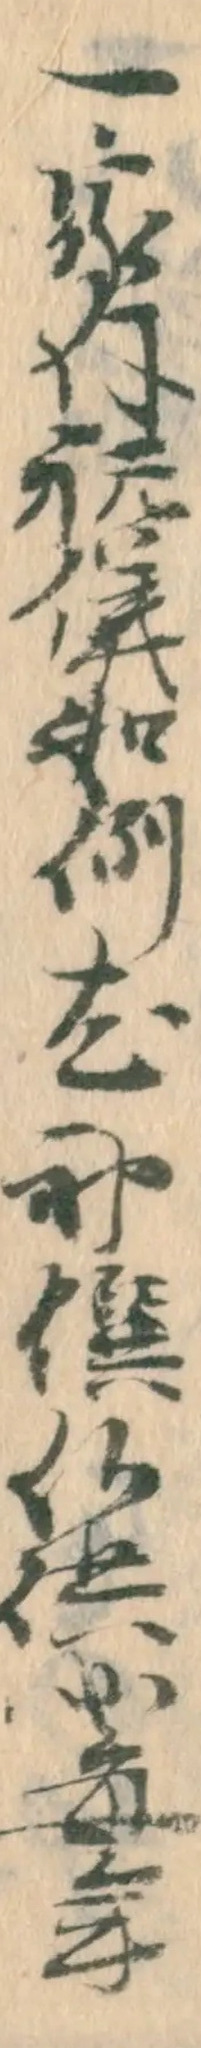一家内祝儀如例尤神饌仏供如毎年
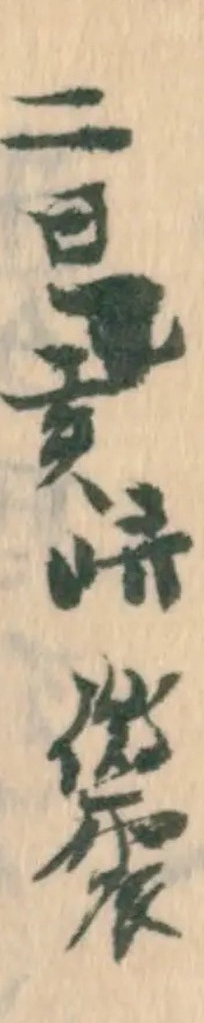二日丁亥晴微震
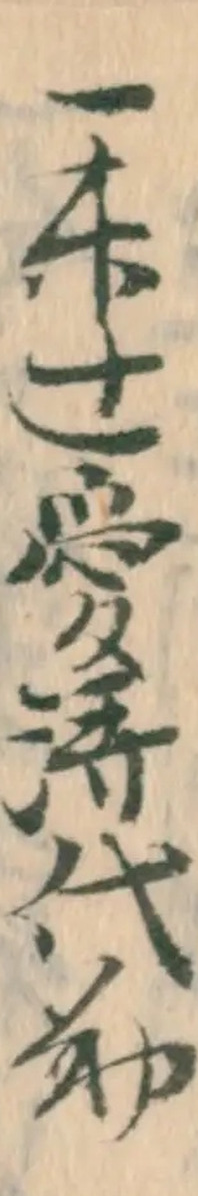一東辻愛涛代勤
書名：禁裏御所御用日記. [131]
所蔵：国立国会図書館 National Diet Library, JAPAN
